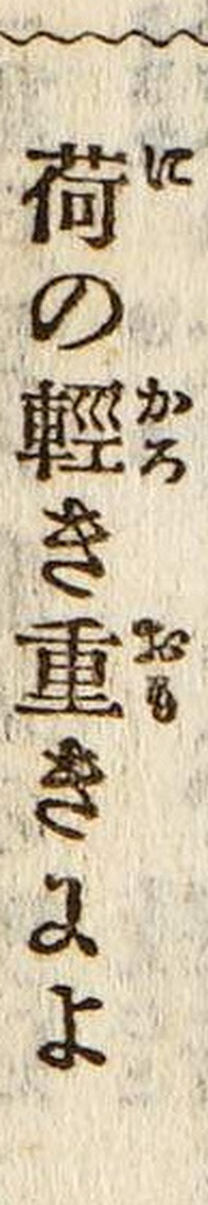荷の軽き重きによ
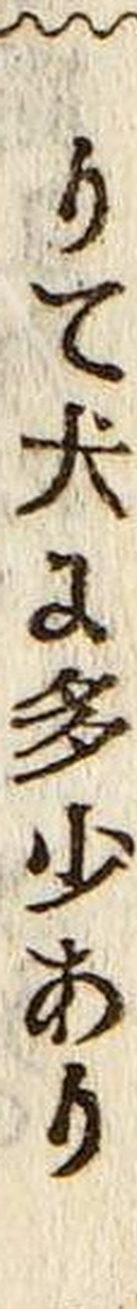りて犬に多少あり
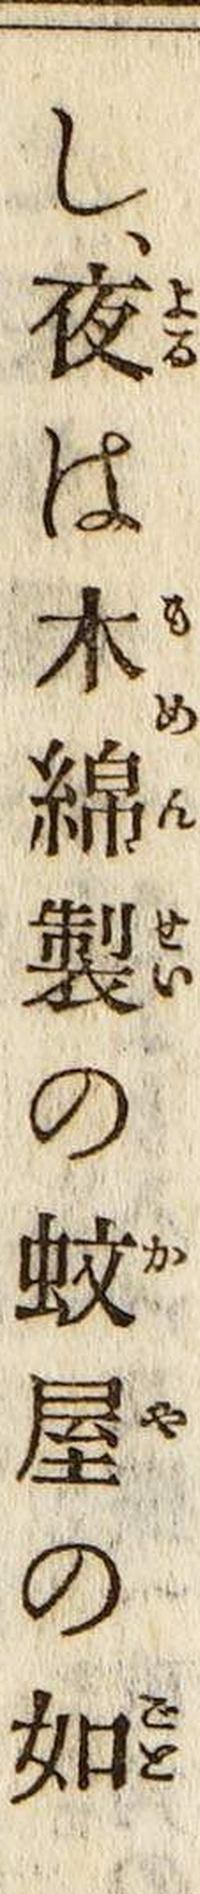し、夜は木綿製の蚊屋の如
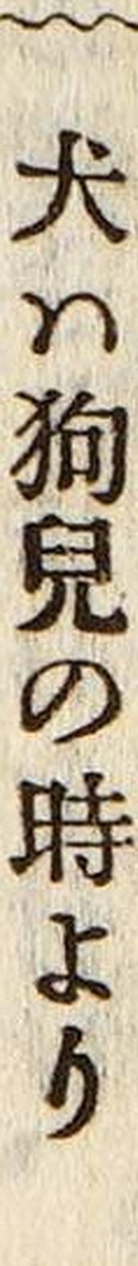犬ハ狗児の時より
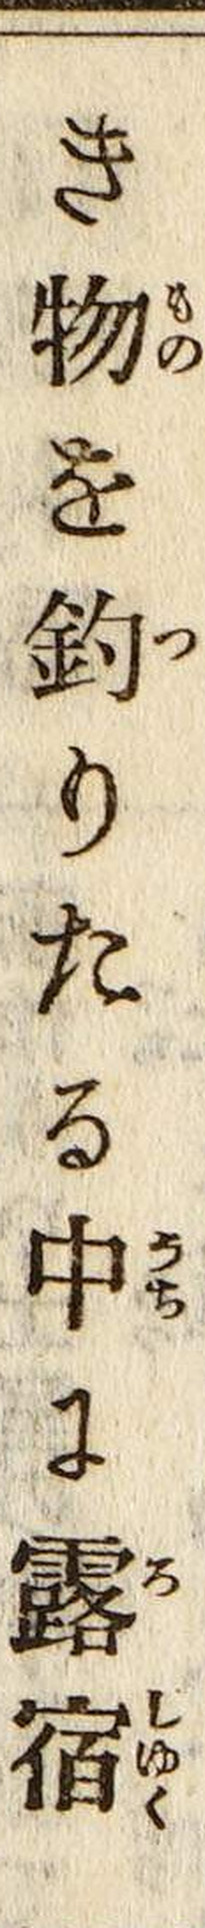き物を釣りたる中に露宿
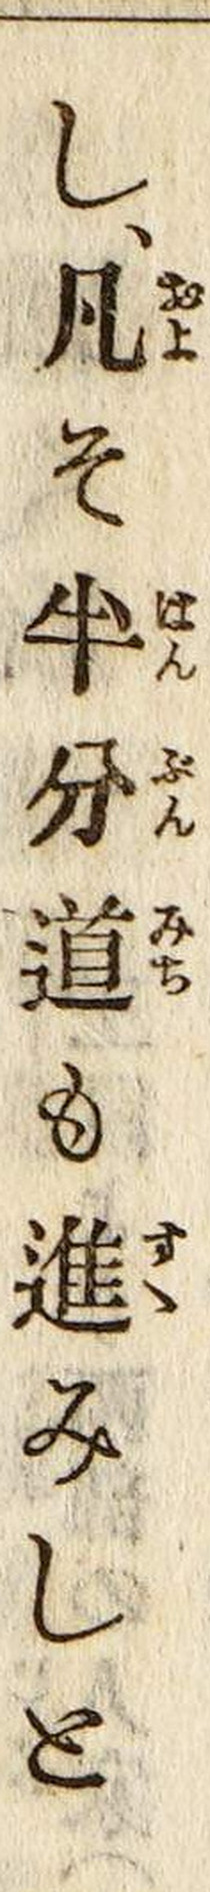し、凡そ半分道も進みしと
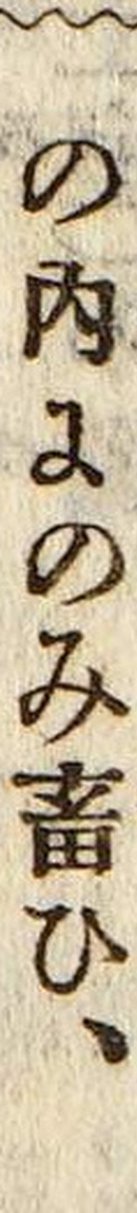の内にのみ畜ひ、
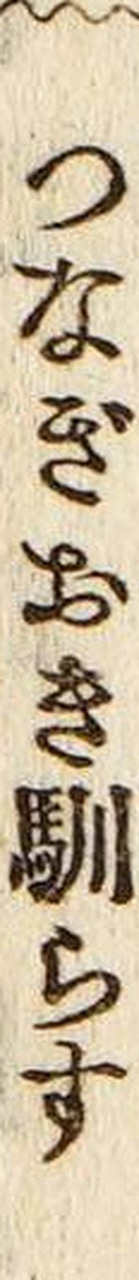つなぎおき馴らす
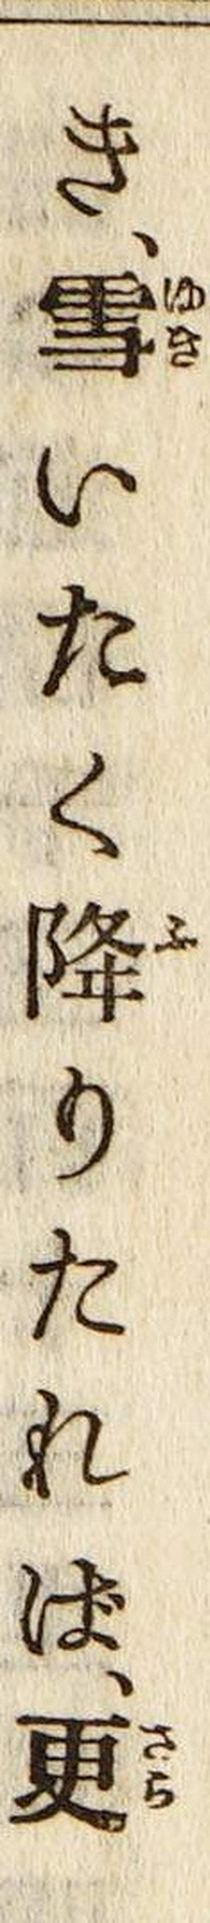き、雪いたく降りたれば、更
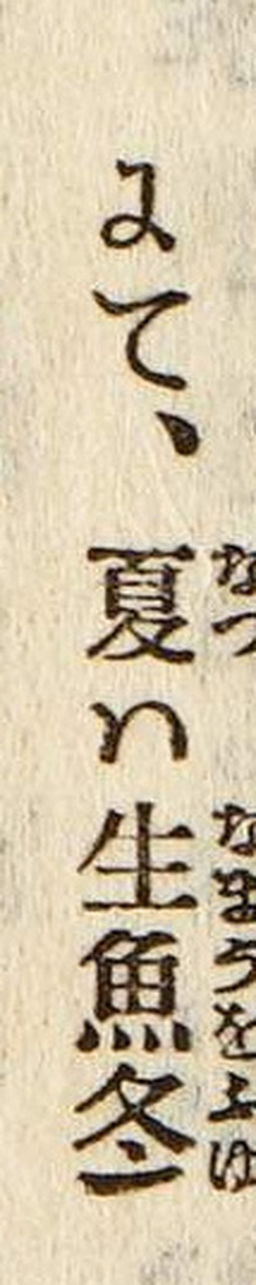にて、夏ハ生魚冬
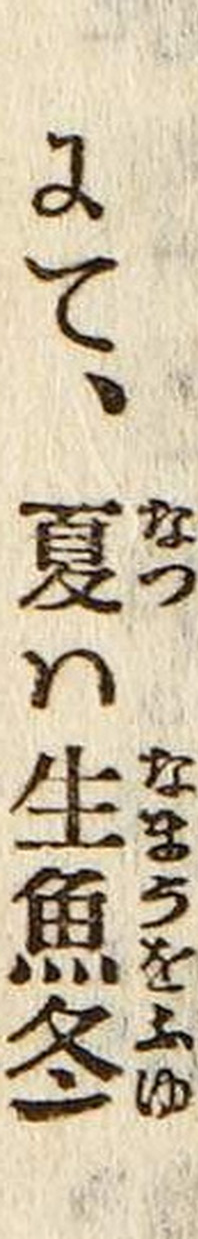にて、夏ハ生魚冬
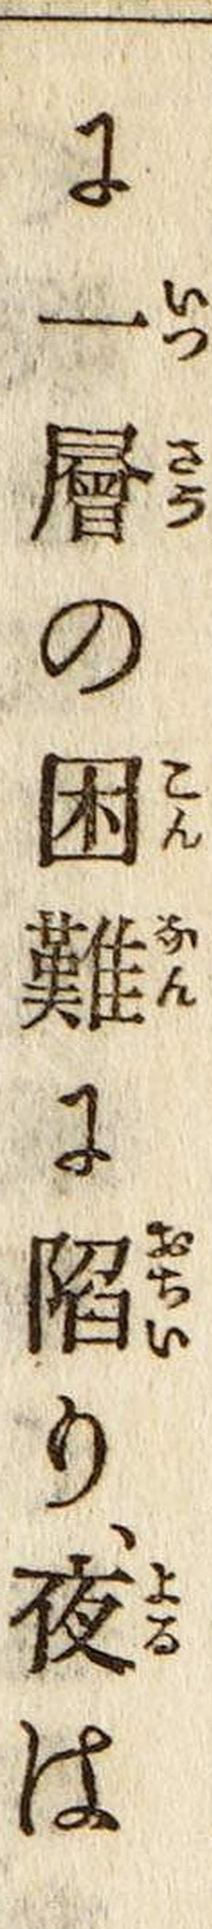に一層の困難に陥り、夜は
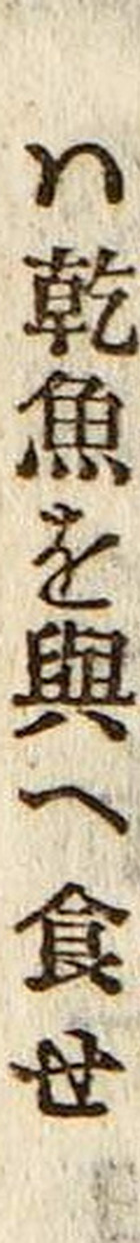ハ乾魚を与へ食せ
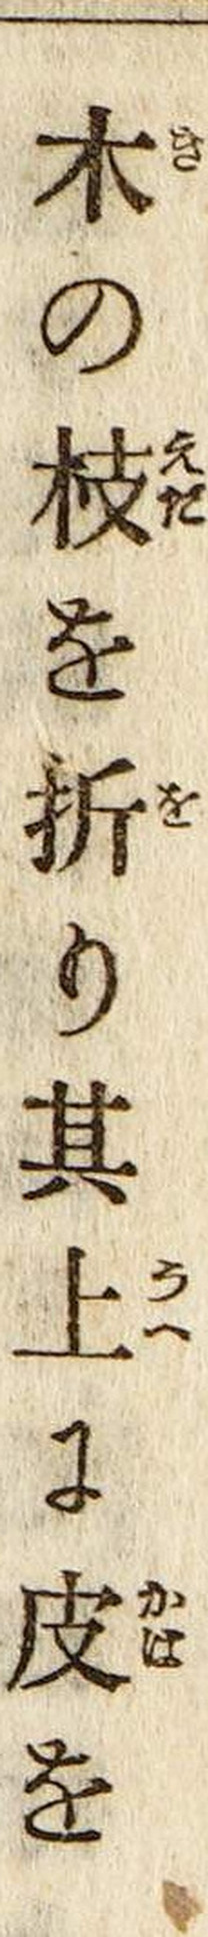木の枝を折り其上に皮を
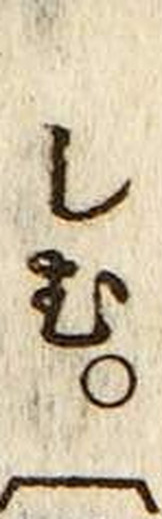しむ。

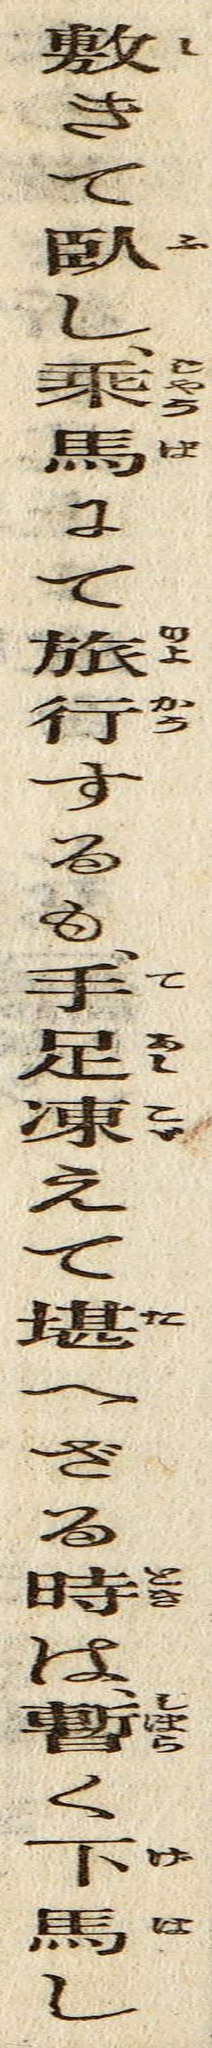敷きて臥し、乗馬にて旅行するも、手足凍えて堪へざる時は、暫く下馬し
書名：日本漂流譚
